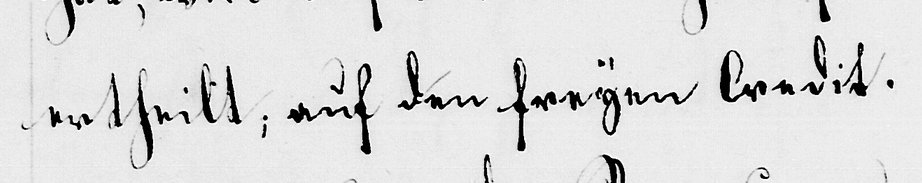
ertheilt, auf den freyen Credit.
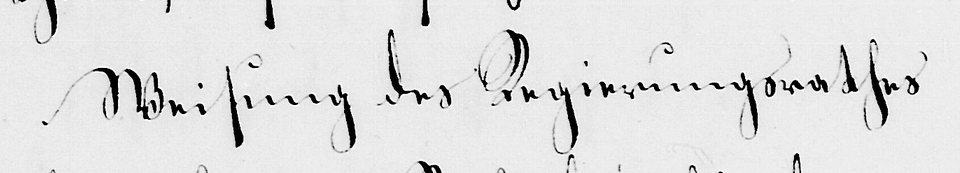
Weisung des Regierungsrathes
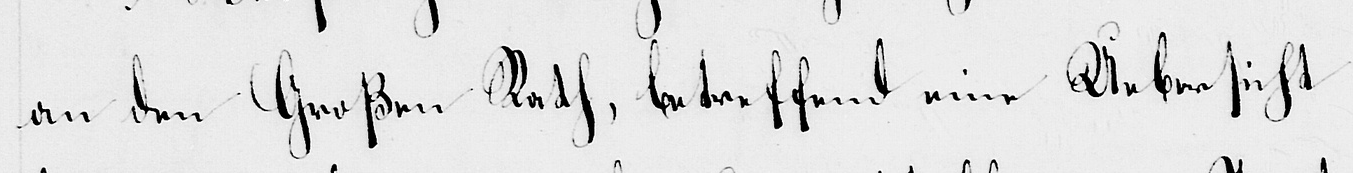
an den Großen Rath, betreffend eine Uebersicht
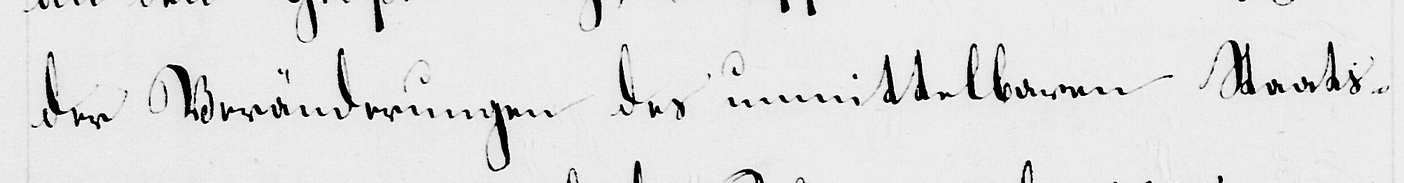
der Veränderungen des unmittelbaren Staats¬
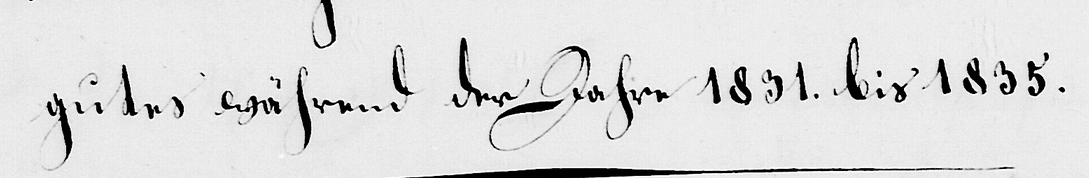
gutes während der Jahre 1831. bis 1835.
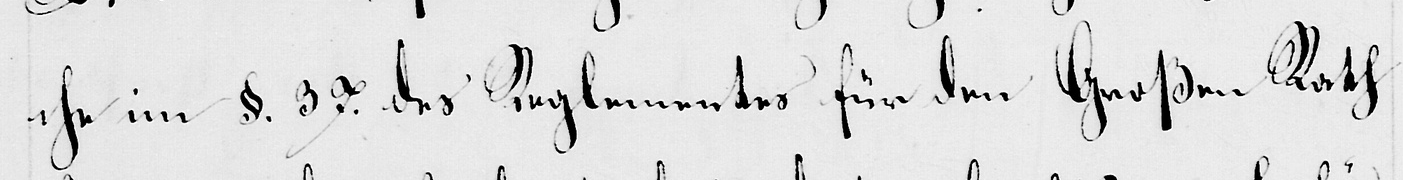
che im §. 37. des Reglementes für den Großen Rath
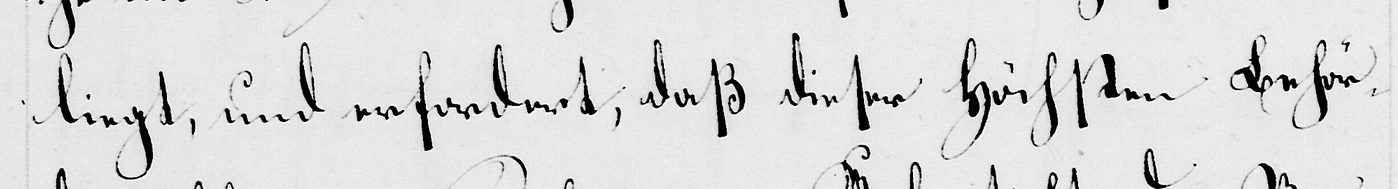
liegt, und erfordert, daß dieser Höchsten Behör¬
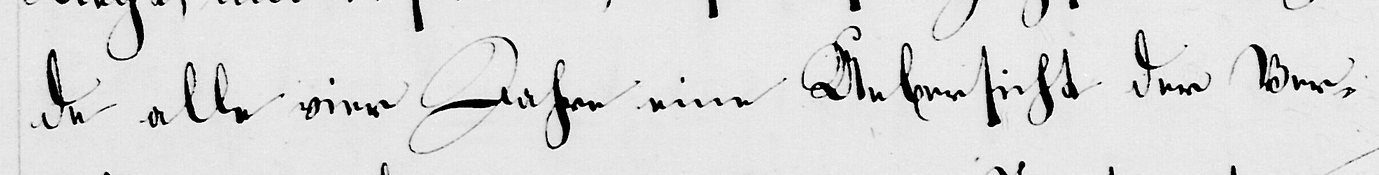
de alle vier Jahre eine Uebersicht der Ver¬
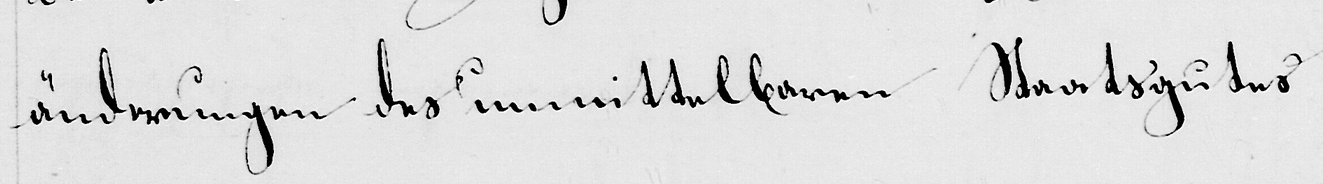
änderungen des unmittelbaren Staatsgutes
